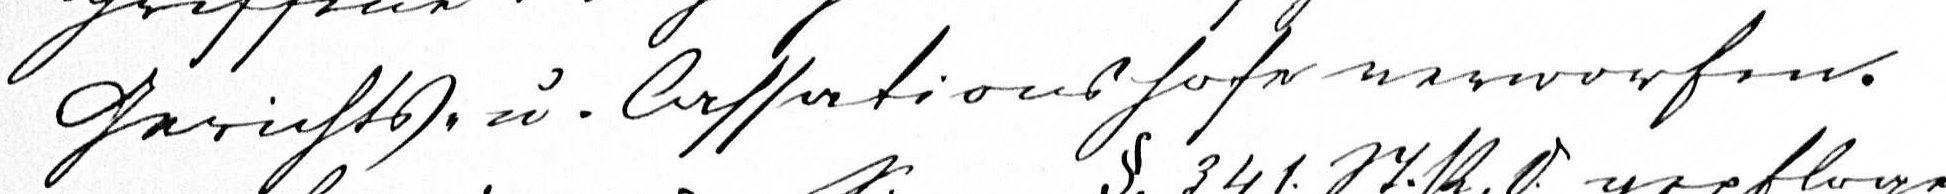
Gerichts- u. Cassationshofe verworfen.
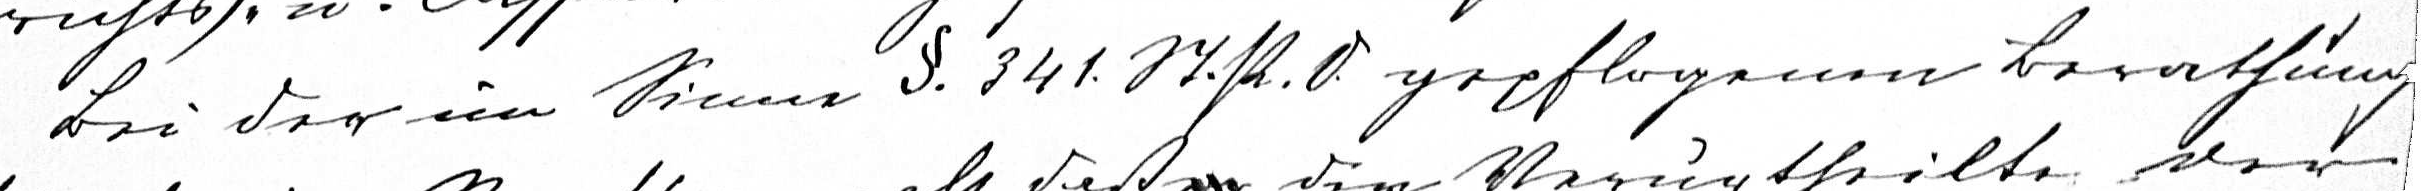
Bei der im Sinne §341. St P O gepflogenen Berathung
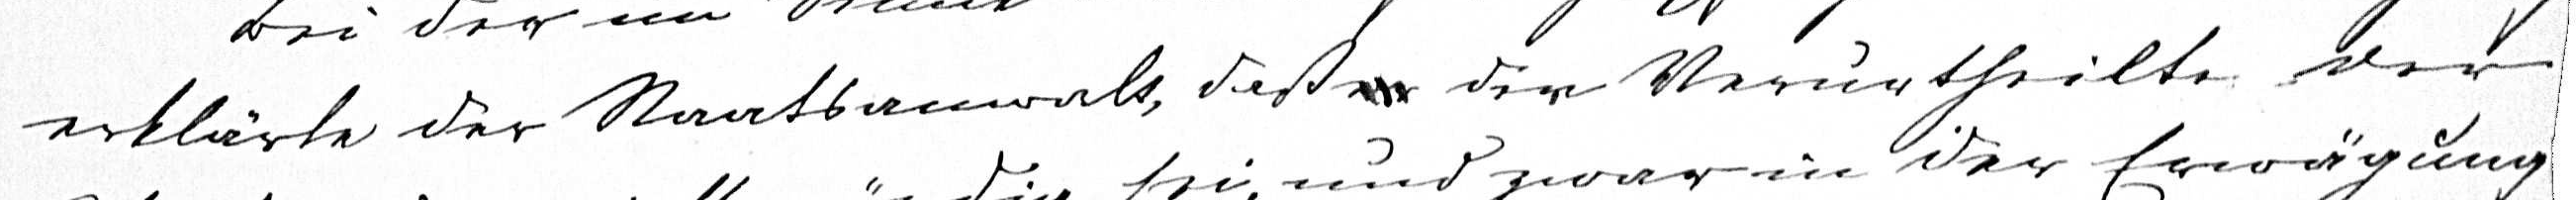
erklärte der Staatsanwalt, daß der Verurtheilte der
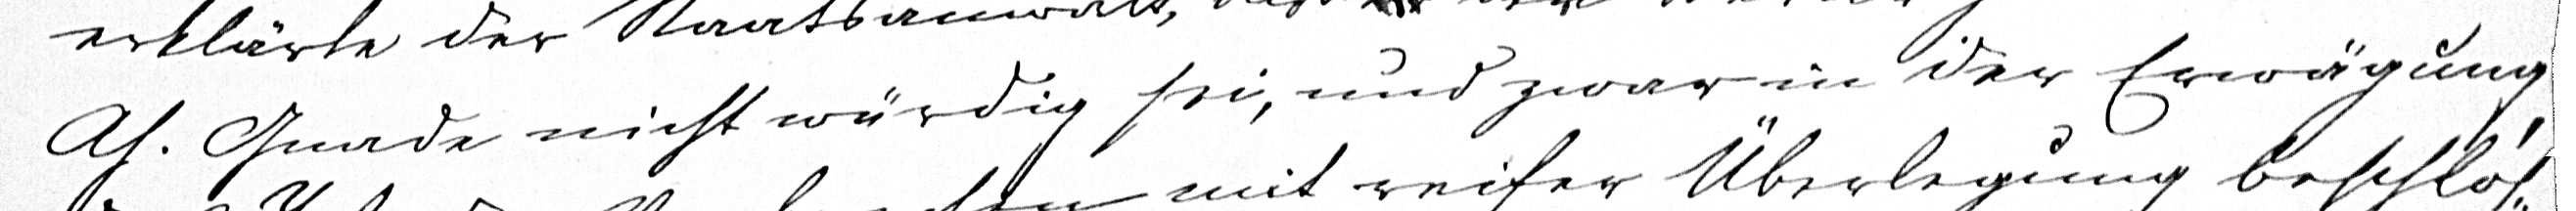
Ah. Gnade nicht würdig sei, und zwar in der Erwägung
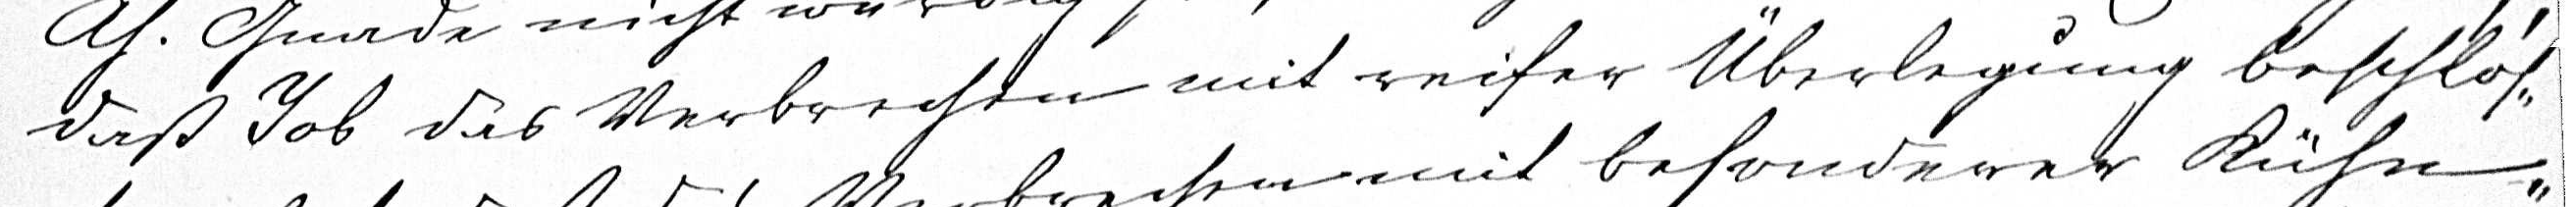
daß Job des Verbrechen mit reifer Überlegung beschlos¬
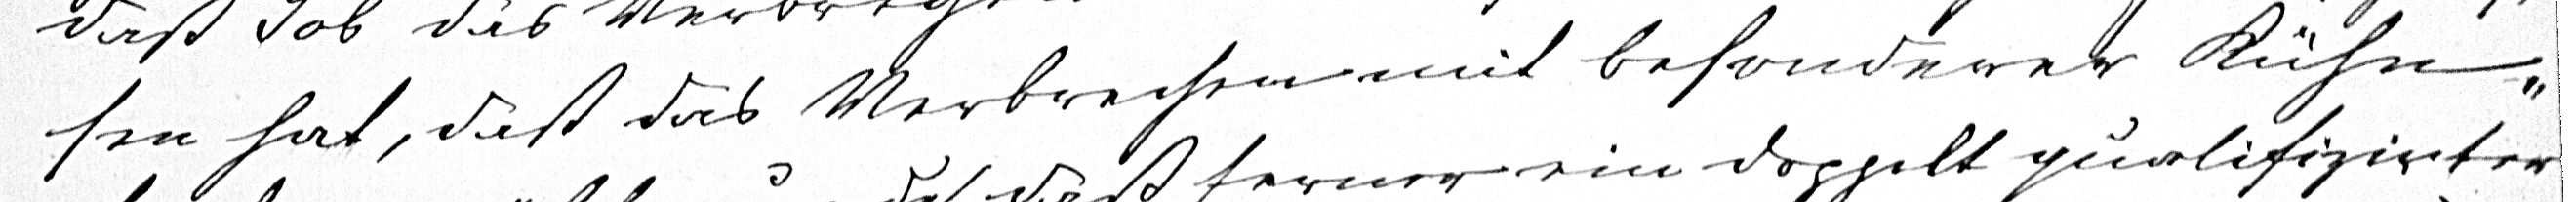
sen hat, daß das Verbrechen mit besonderer Kühn¬
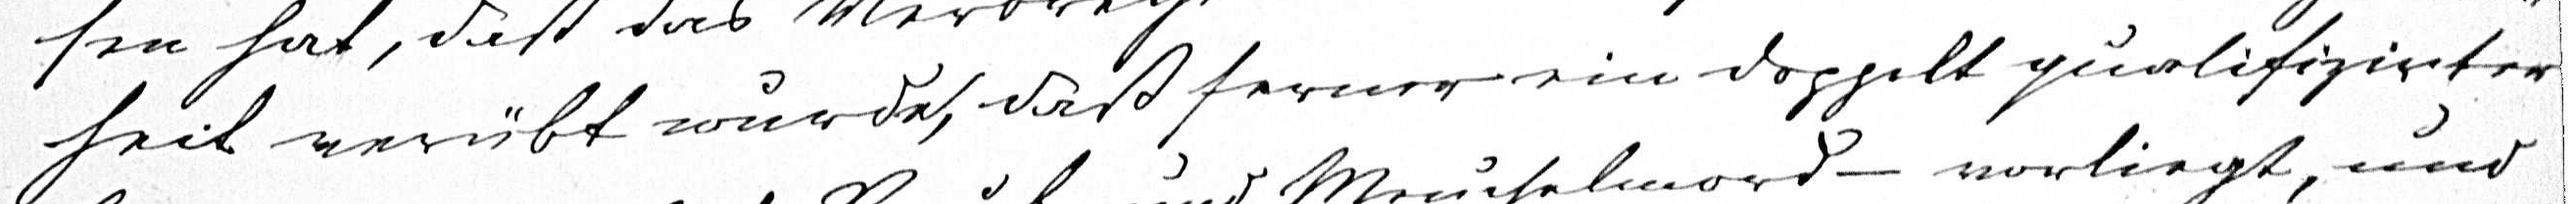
heit verübt wurde, daß ferner ein doppelt qualifizirter
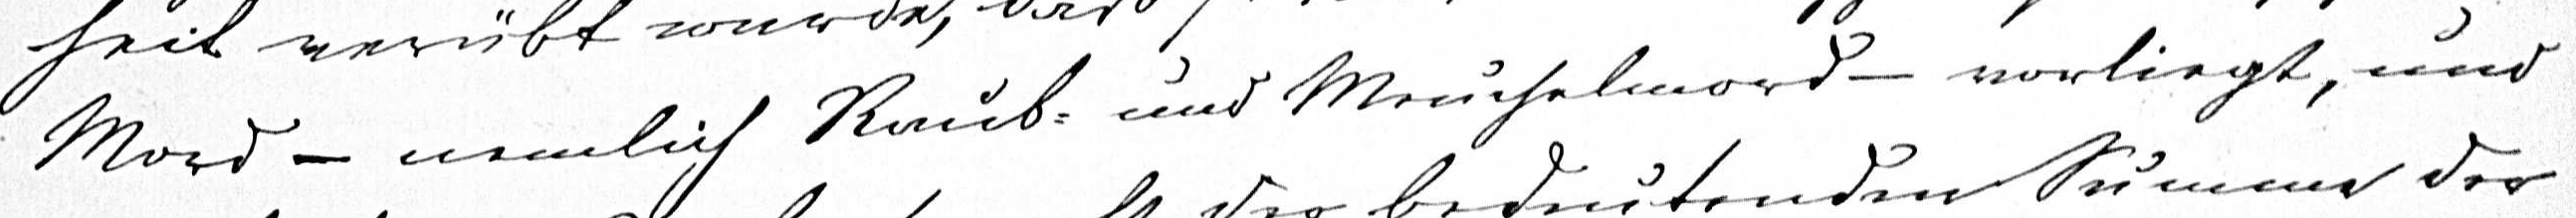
Mord- nemlich Raub- und Meuchelmord – vorliegt, und
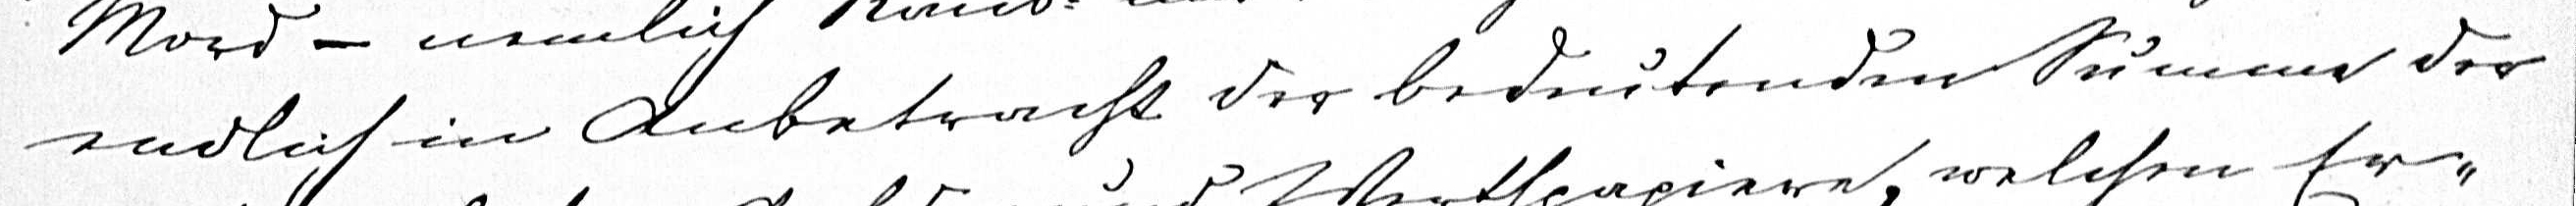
endlich in Anbetracht der bedeutenden Summe des
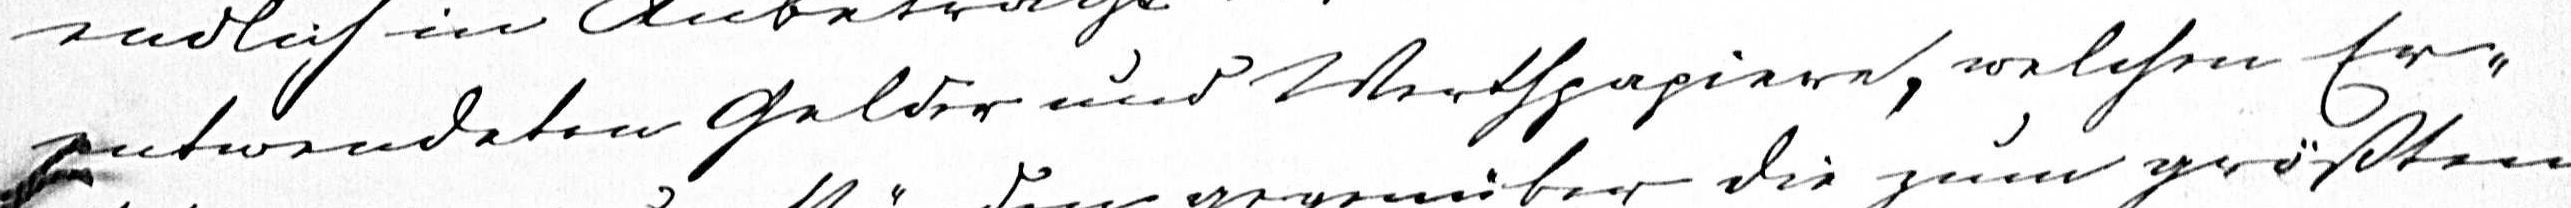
entwendeten Geldes und Werthpapiere, welchen Er¬
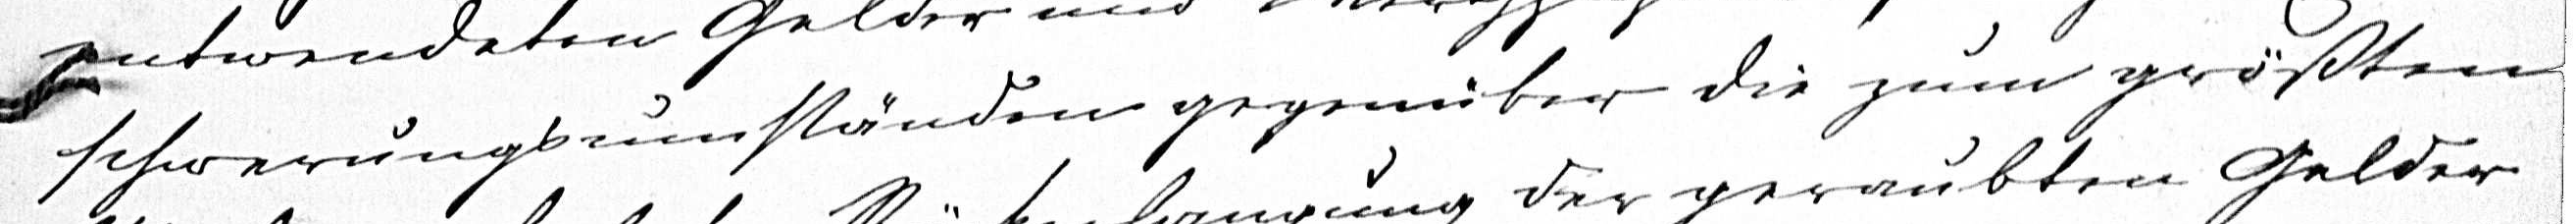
schwerungsumständen gegenüber die zum größten
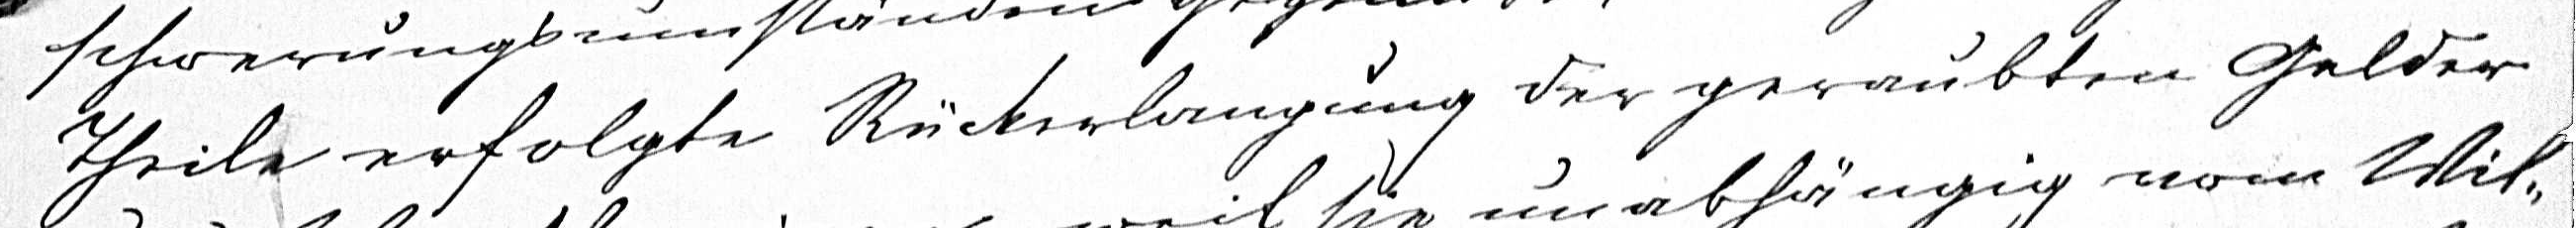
Theile erfolgte Rückerlangung der geraubten Gelder
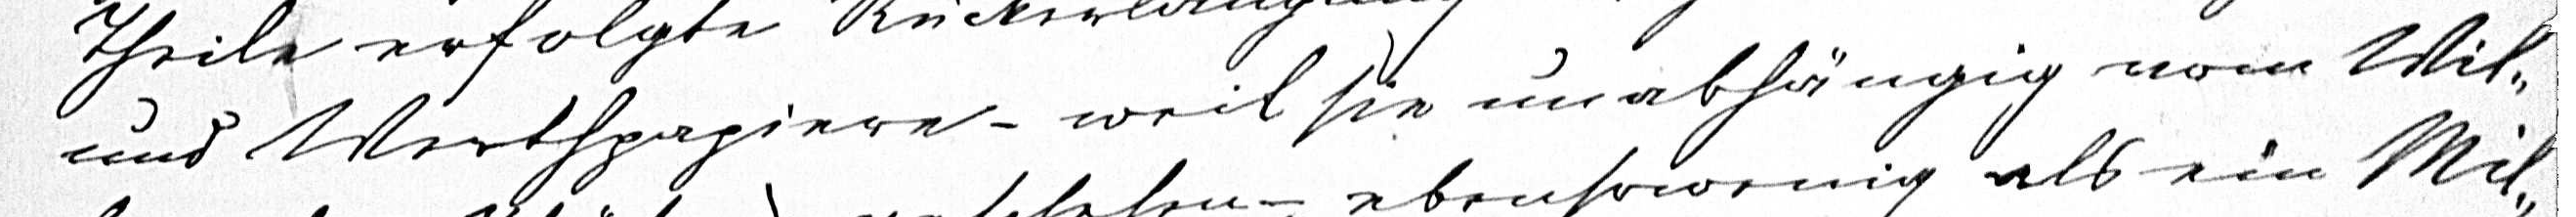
und Werthpapiere – weil sie unabhängig vom Wil¬
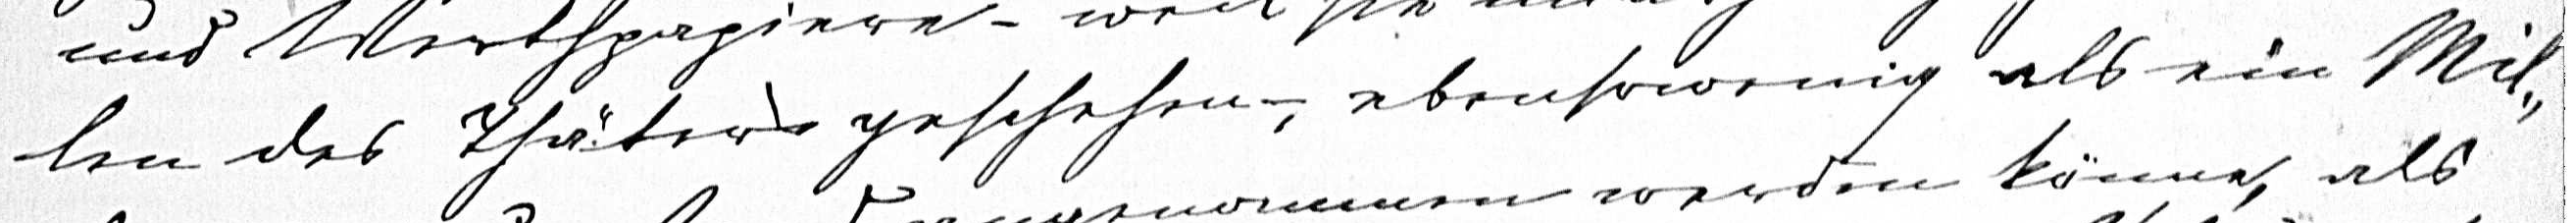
len des Thäters geschehen--, ebensowenig als ein Mil¬
